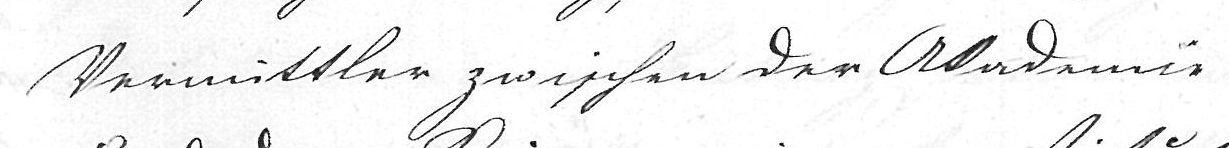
Vermittler zwischen der Akademie
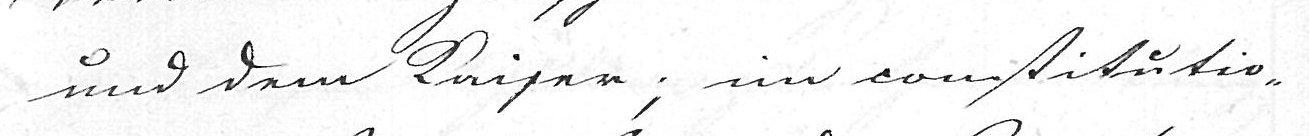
und dem Kaiser, im constitutio-
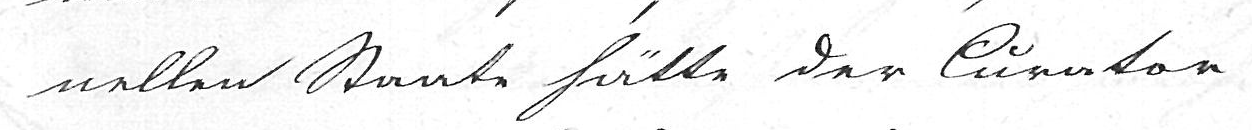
nellen Staate hätte der Curator
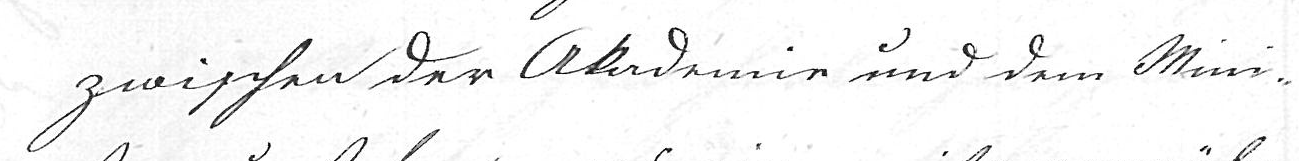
zwischen der Akademie und dem Mini-
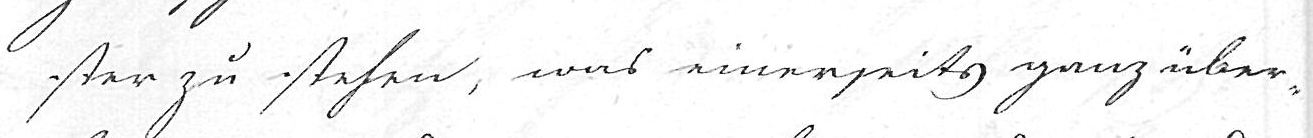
ter zu stehen, was einerseits ganz über-
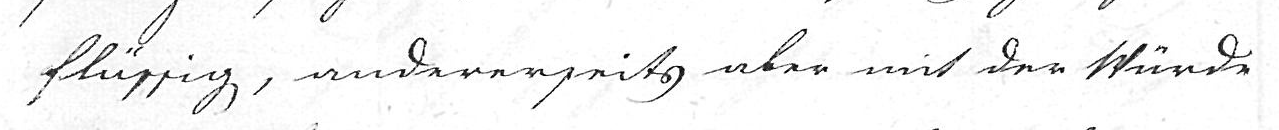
flüssig, andererseits aber mit der Würde
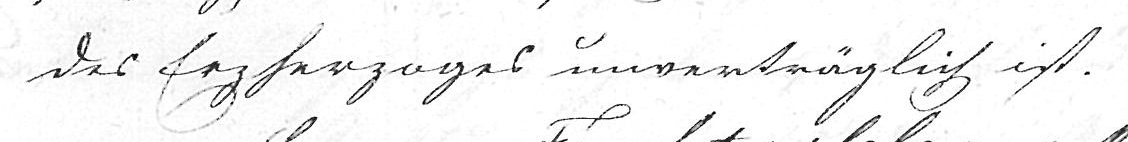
des Erzherzoges unverträglich ist.
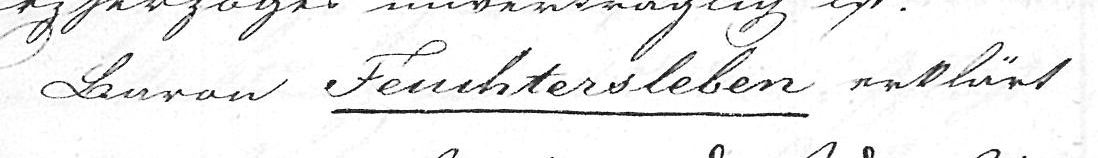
Baron Feuchtersleben erklärt
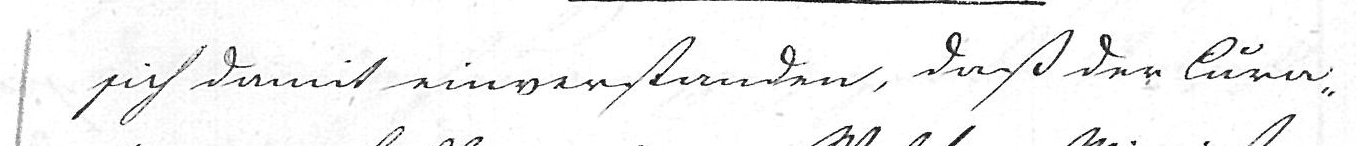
sich damit einverstanden, daß der Cura-
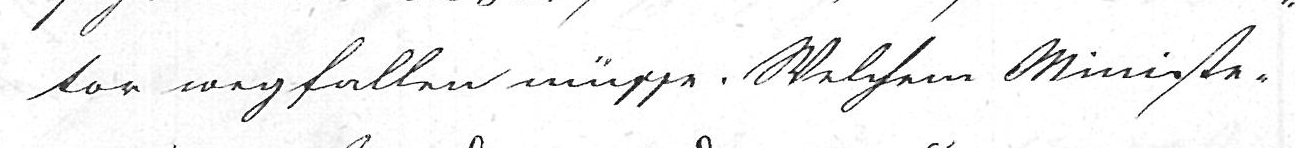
vor wegfallen müsse. Welchem Ministe-
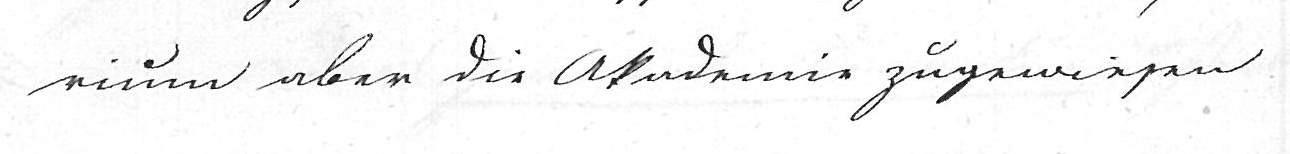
rium aber die Akademie zugewiesen
